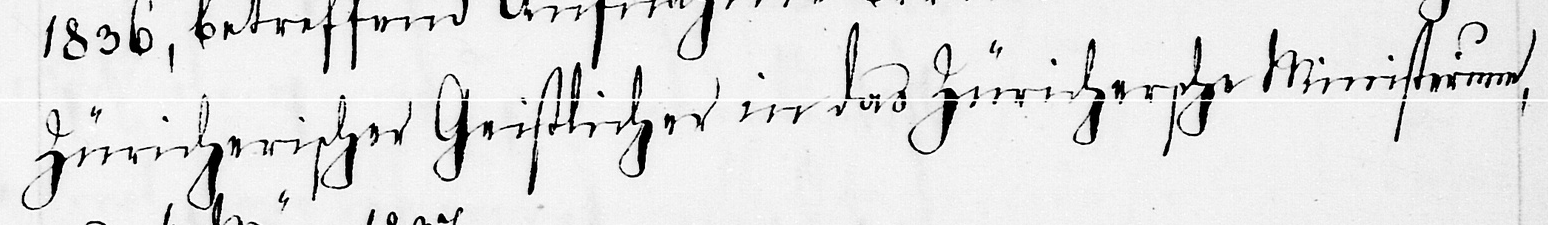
Zürcherischer Geistlicher in das Zürichersche Ministerium,
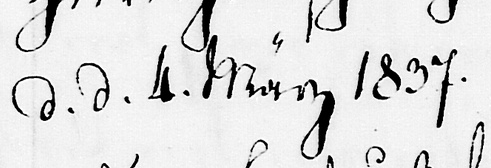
d. d. 4. März 1837.
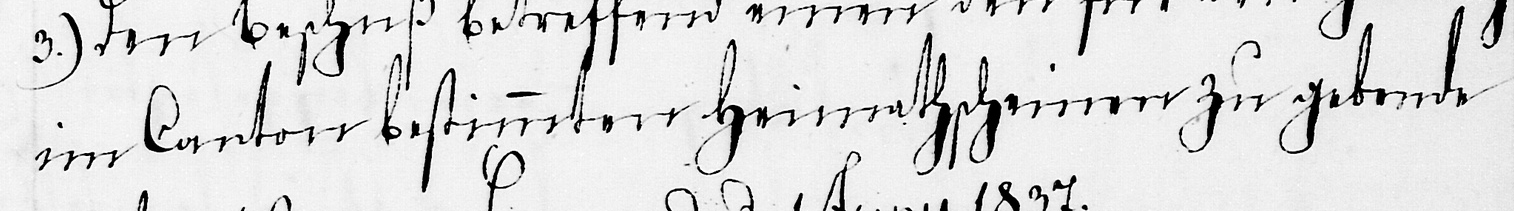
im Canton bestimmten Heimathscheinen zu gebende
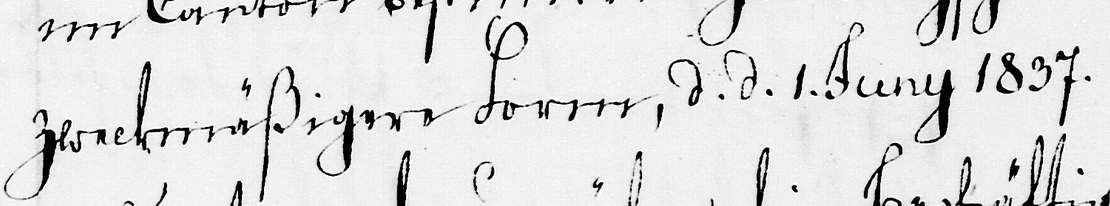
zweckmäßigere Form, d. d. 1. Juny 1837.
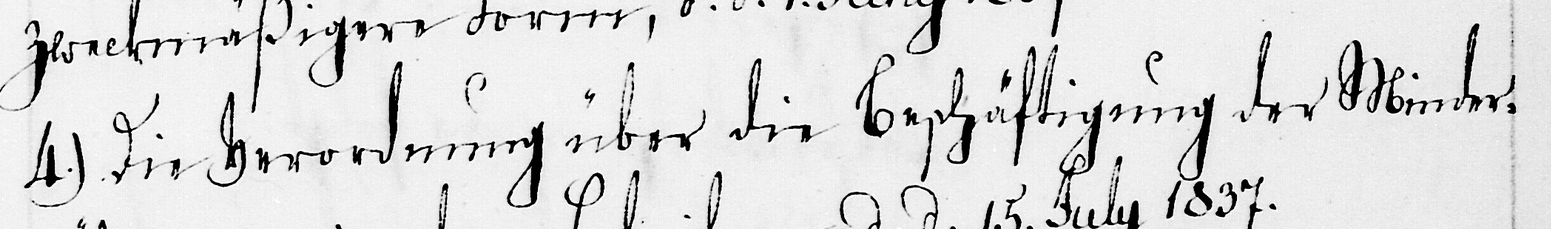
4.) Die Verordnung über die Beschäftigung der Minder¬
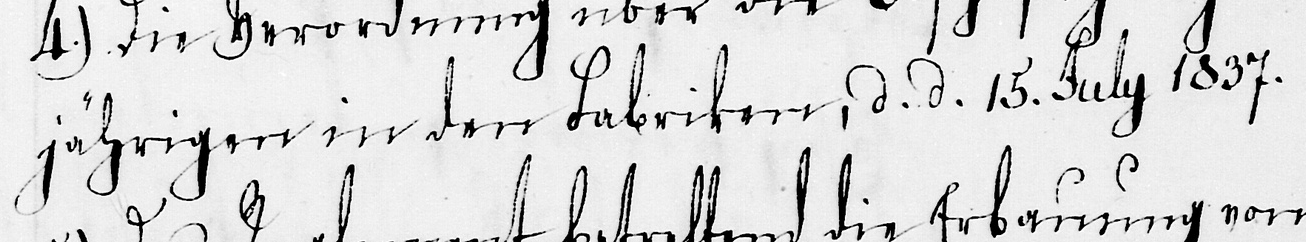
jährigen in den Fabriken, d. d. 15. July 1837.
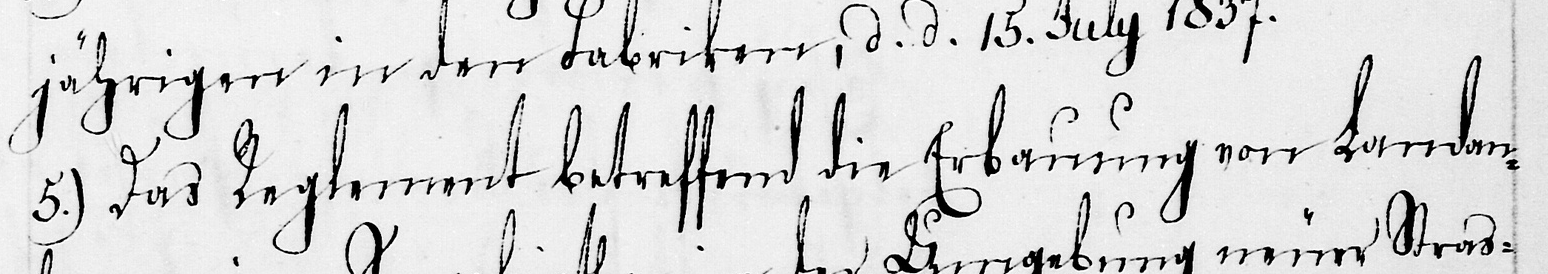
5.) Das Reglement betreffend die Erbauung von Landan¬
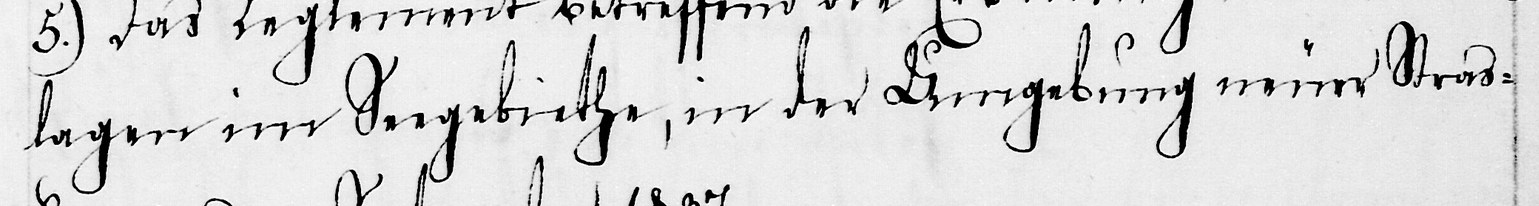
lagen im Seegebiethe, in der Umgebung neuer Straß¬
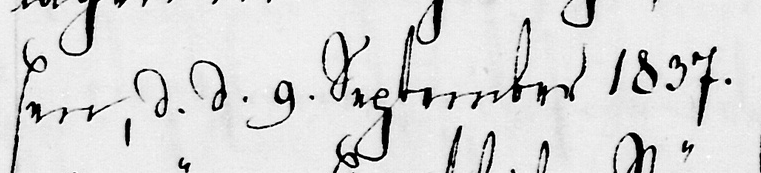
en, d. d. 9. September 1837.
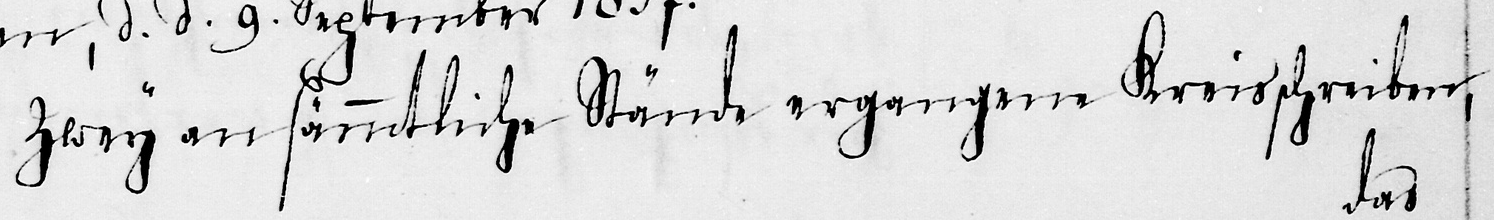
Zwey an sämmtliche Stände ergangene Kreisschreiben,
